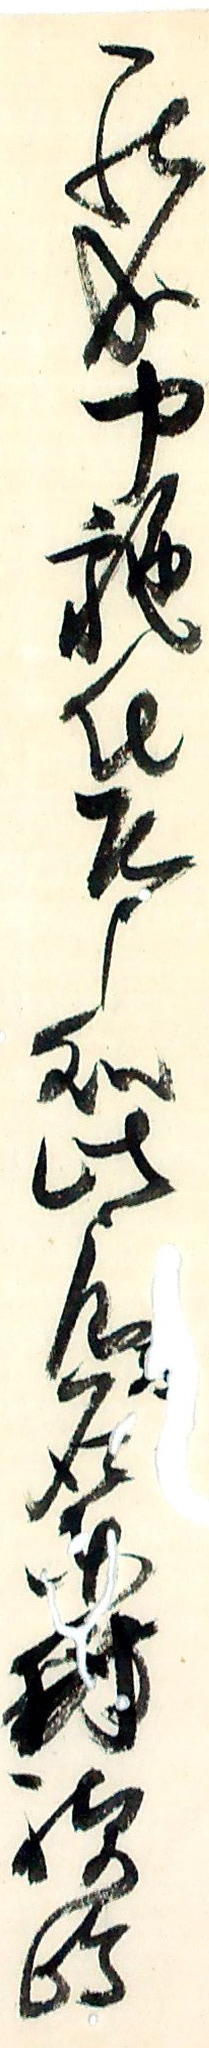罷成中絶仕居申処此度東名東村禎島
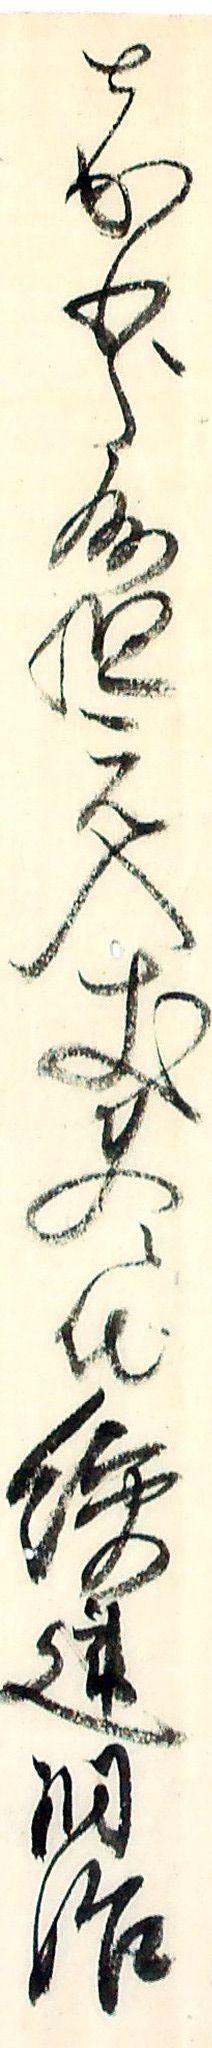嘉五郎殿組元入丈夫に仕絞建相始
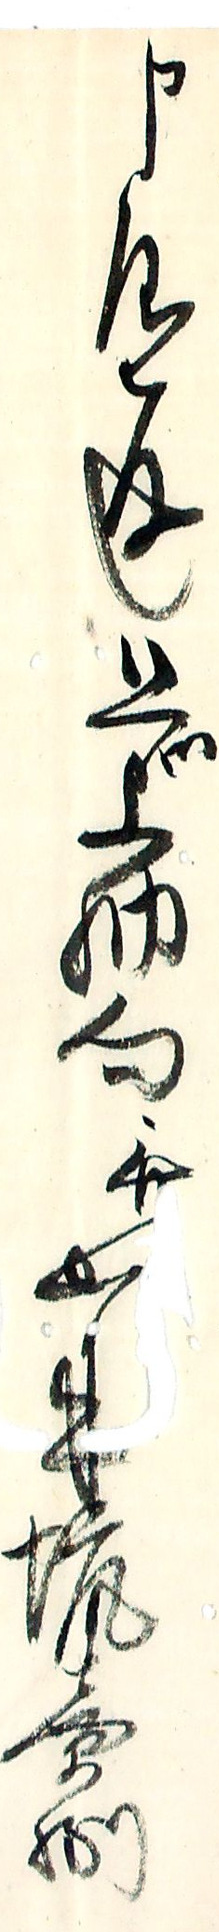申見通且御上納向幷出来蝋売捌
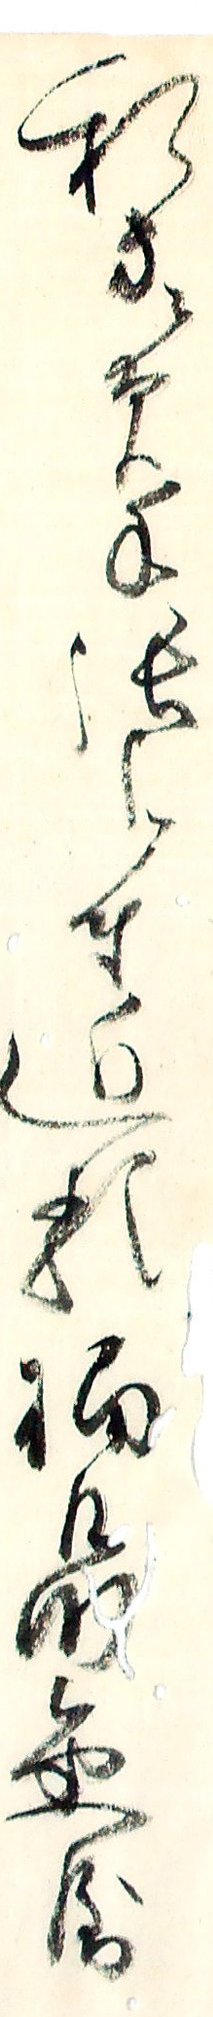私方に受手張申に付近類桶屋町金屋
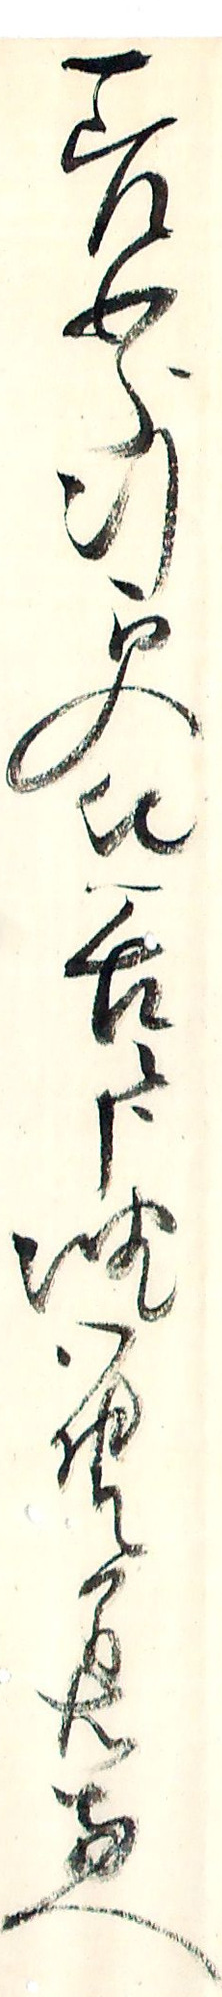善五郎引受仕筈に申談御坐候間右両人

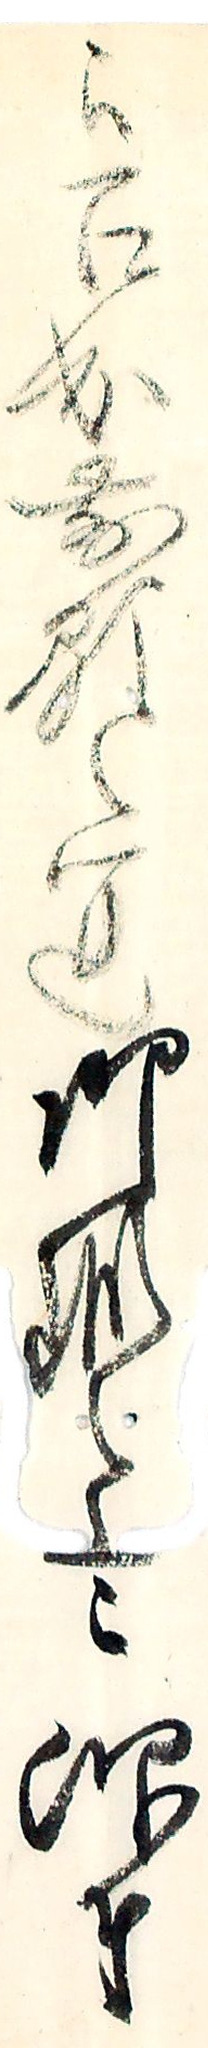被召出前顕之運御鍛之上被仰付
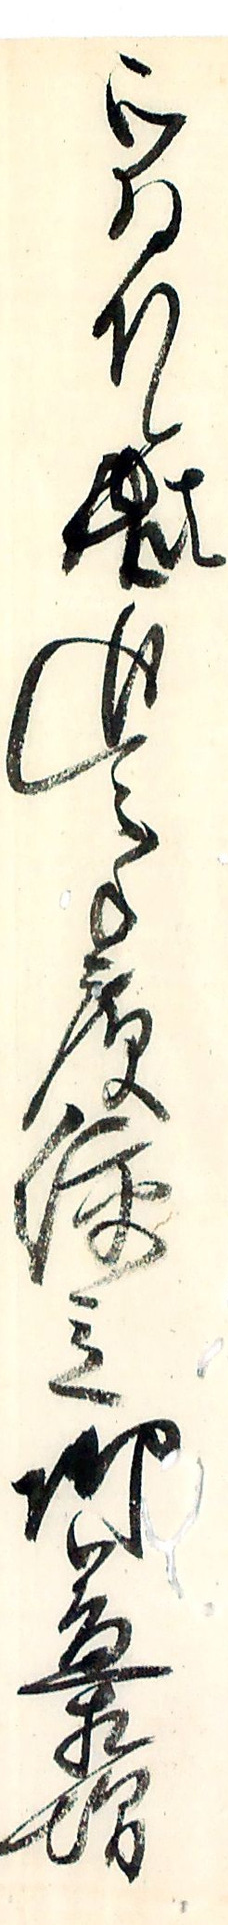被為下候は追々手広絞立御益相増
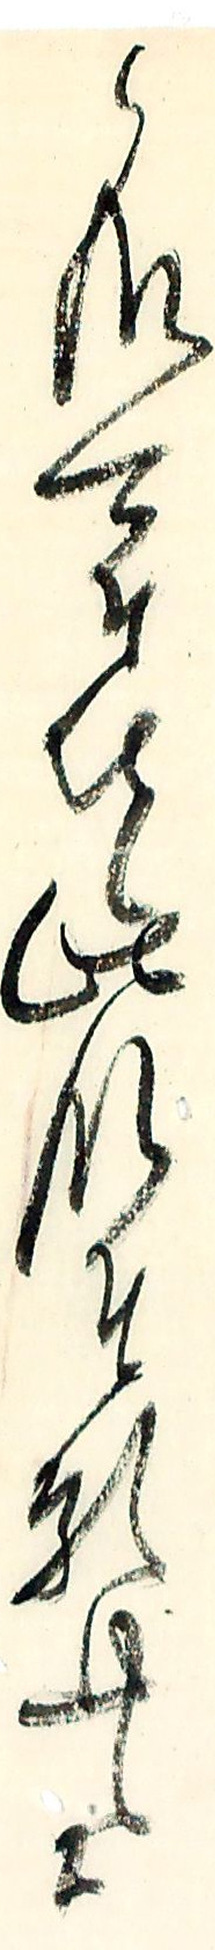候様可奉仕候此段奉願上候以上
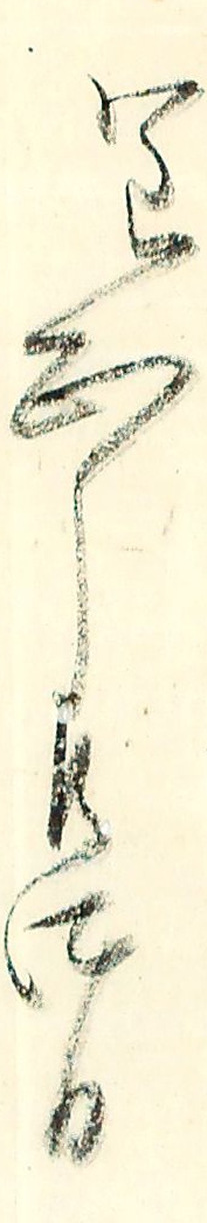閏正月廿四日
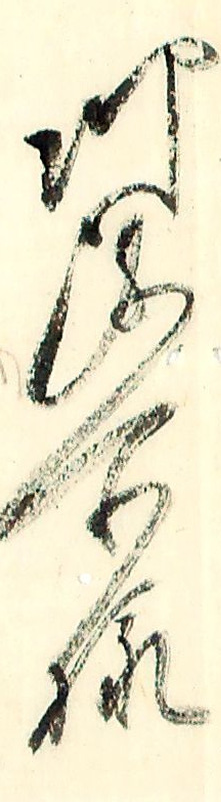御役所様
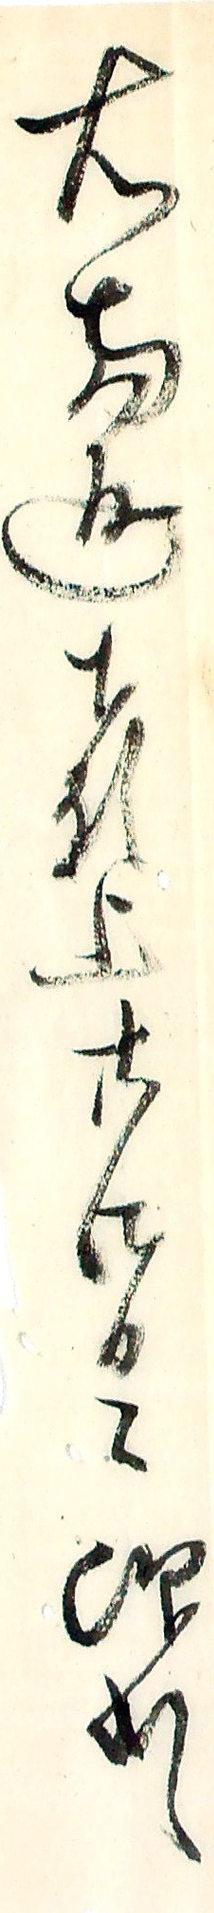右両通奉願上廿四日被仰出候

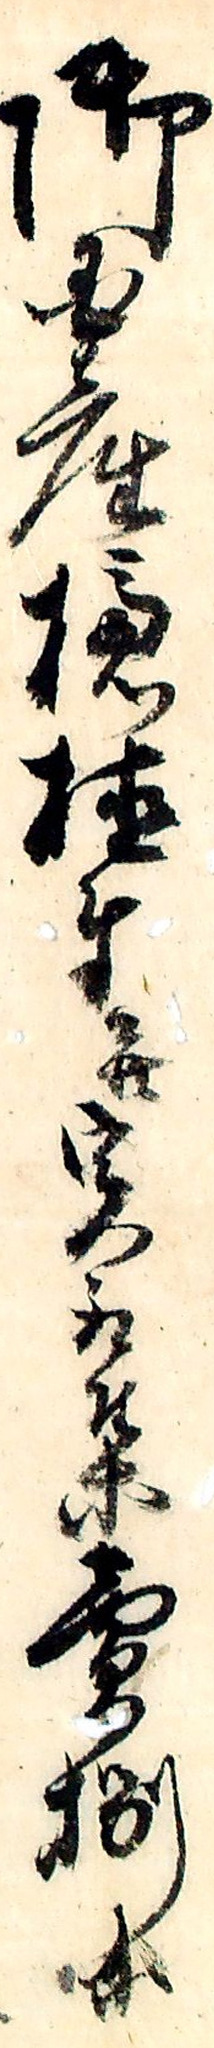御国産櫨植付幷実取集売捌等
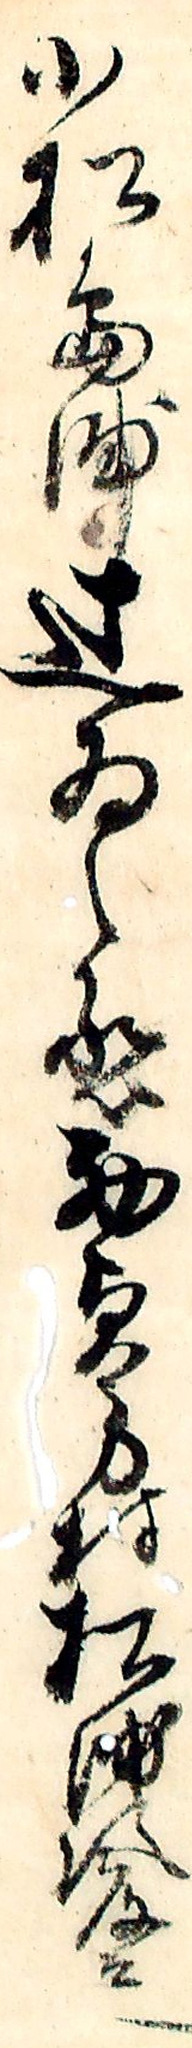小松島浦辻為之丞西貞方村松浦次藤太へ
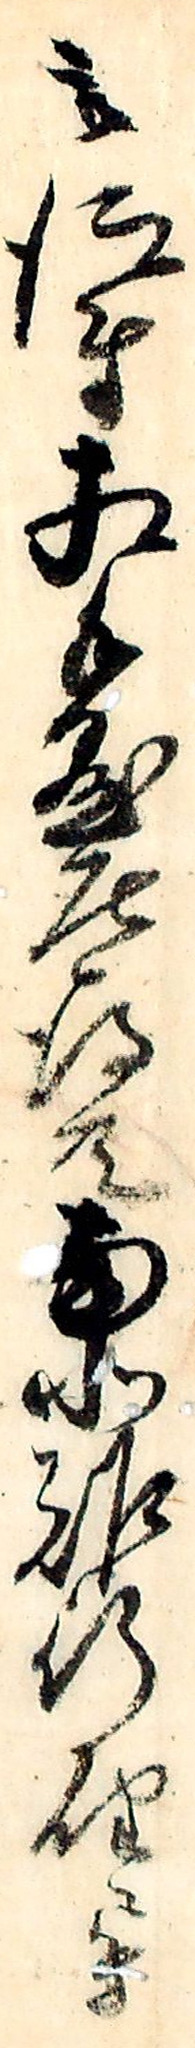被仰付相手懸居候得共南北難行届に付
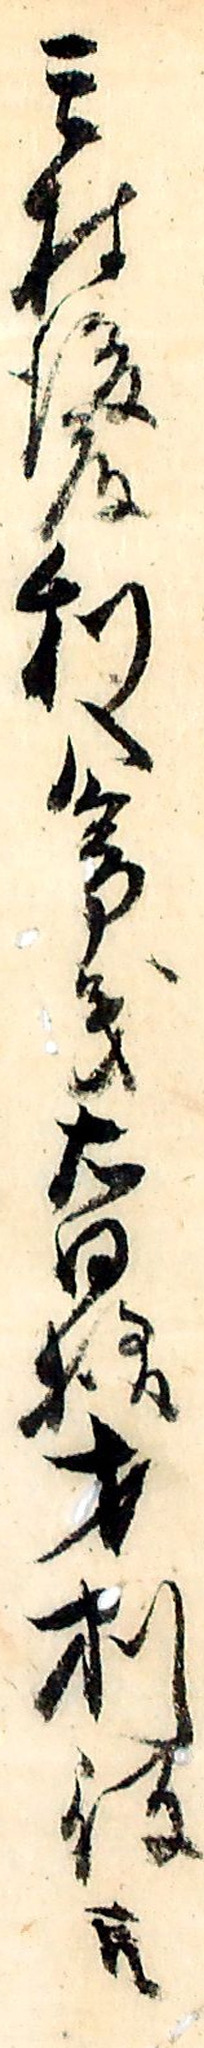其村後藤利八郎義右同様才判役被
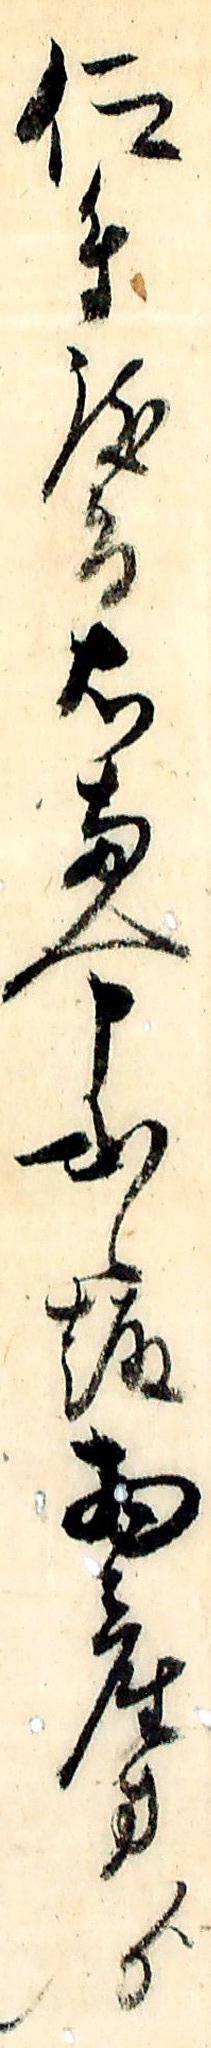仰付度旨右両人申出之趣物産方ゟ
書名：乍恐奉願上覚（御国産櫨植付並実取集売捌等)他
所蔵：鳴門教育大学 Naruto University of Education
